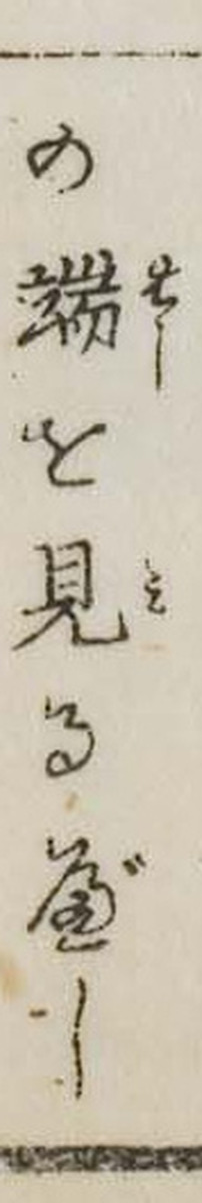の端を見るべし
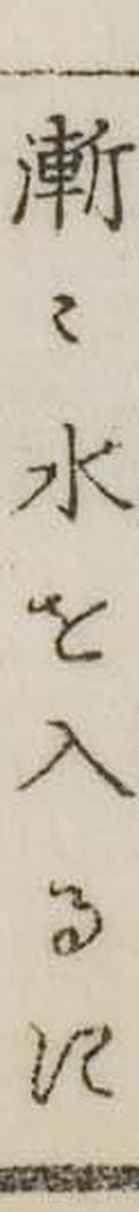漸〻水を入るに
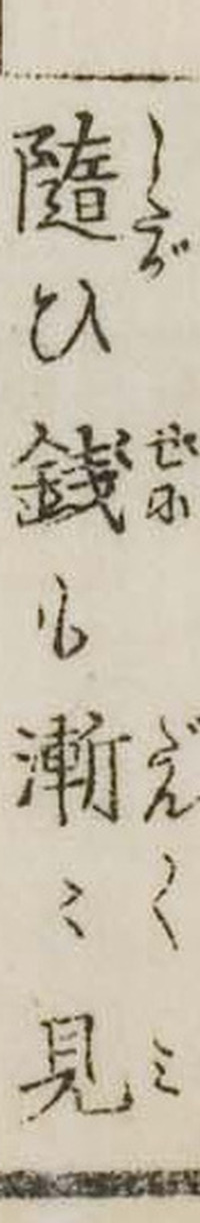随ひ銭も漸〻見
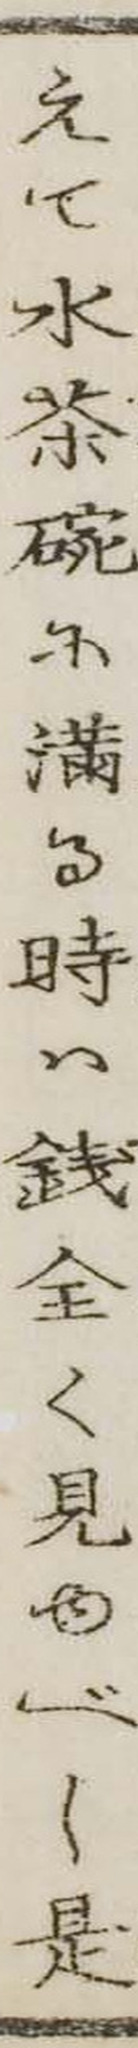えて水茶碗に満る時は銭全く見ゆべし是
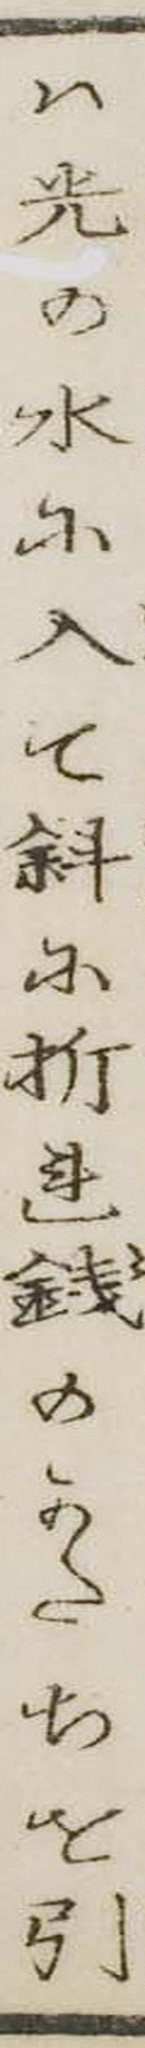は光の水に入て斜に折れ銭のかたちを引
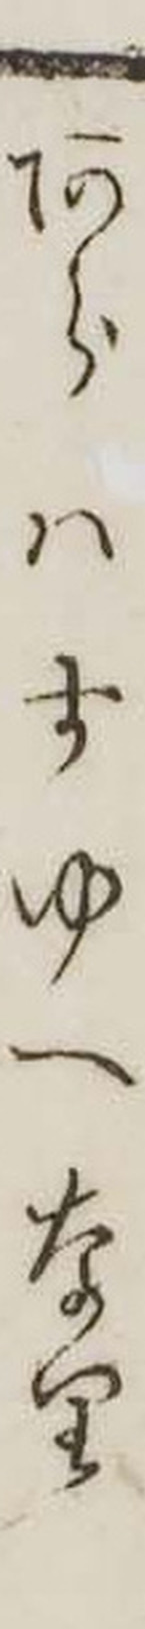あらはすゆへなり
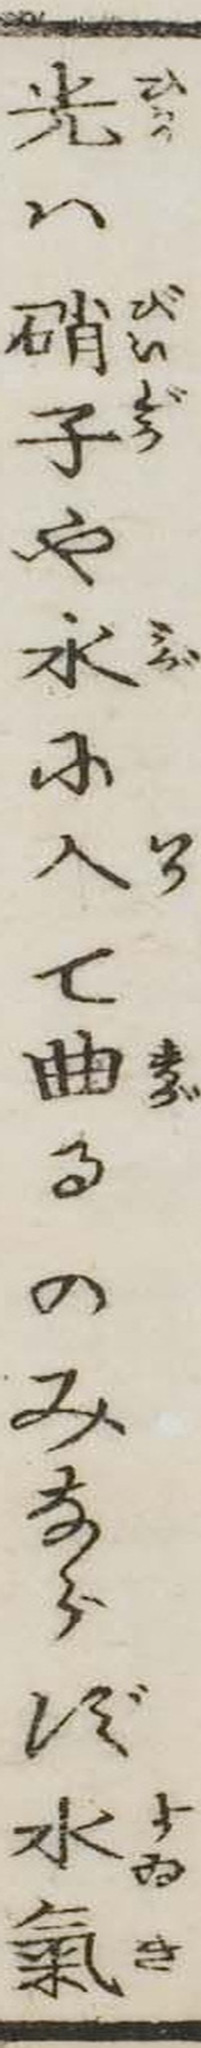光は硝子や水に入て曲るのみならず水氣
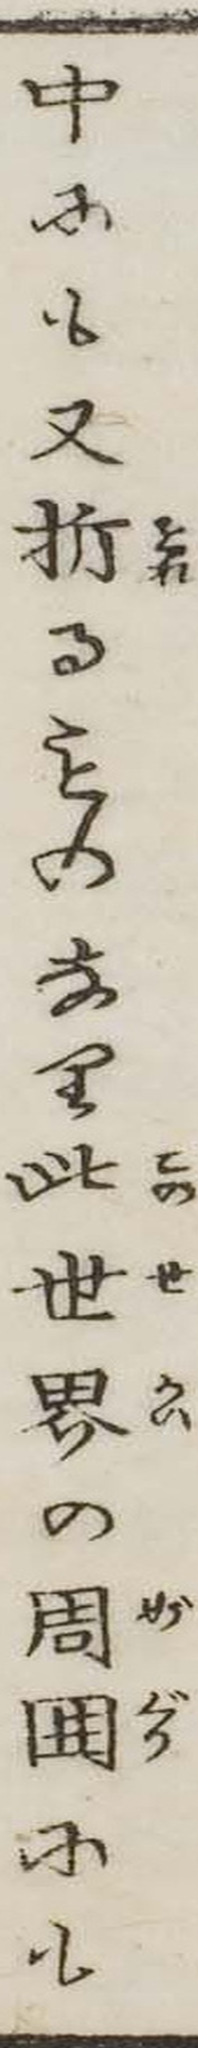中にも又折るものなり此世界の周囲にも
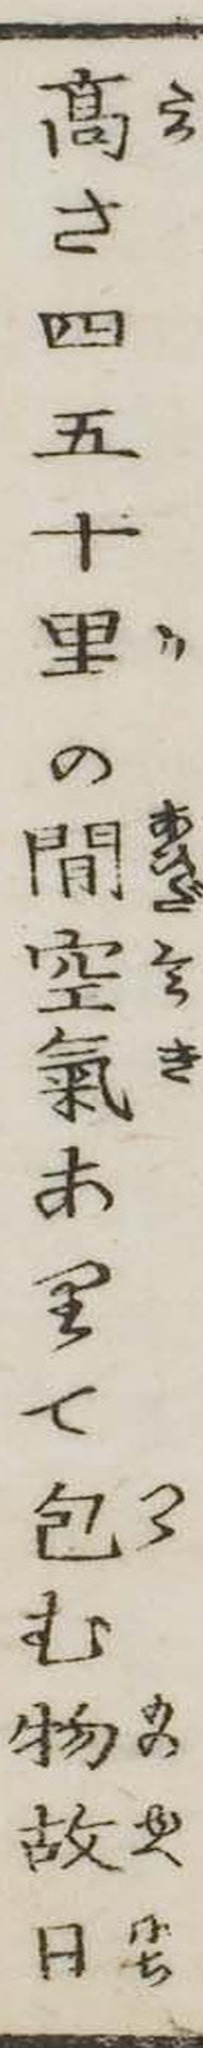髙さ四五十里の間空氣ありて包む物故日
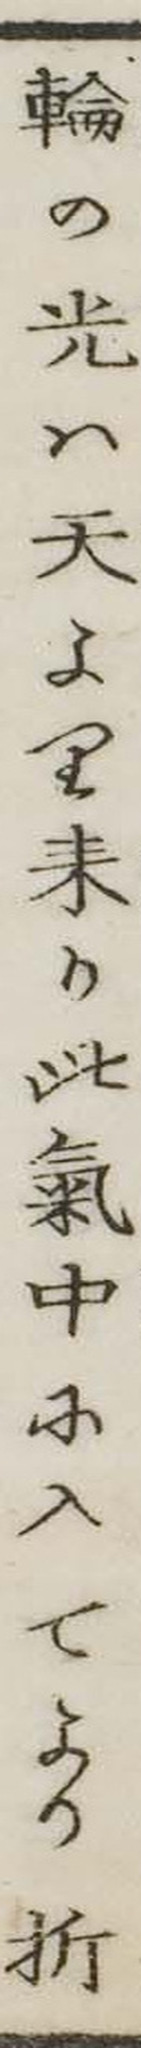輪の光は天より来り此氣中に入てより折
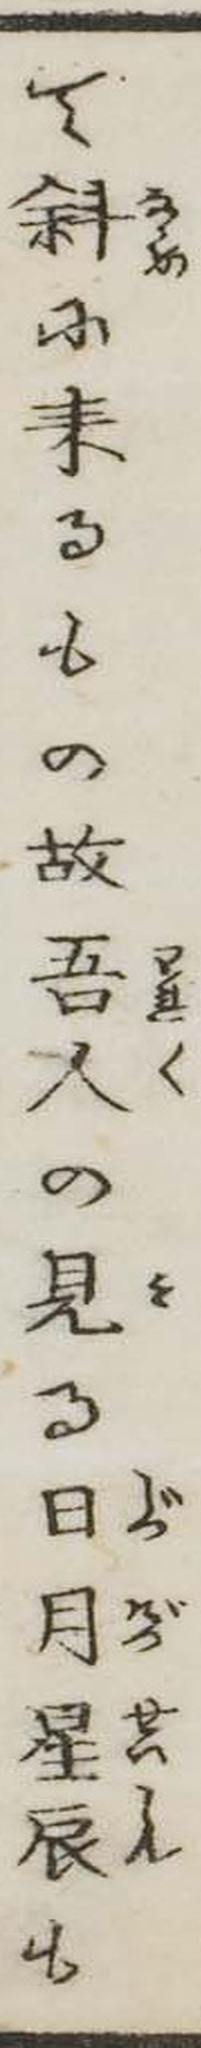て斜に来るもの故吾人の見る日月星辰も
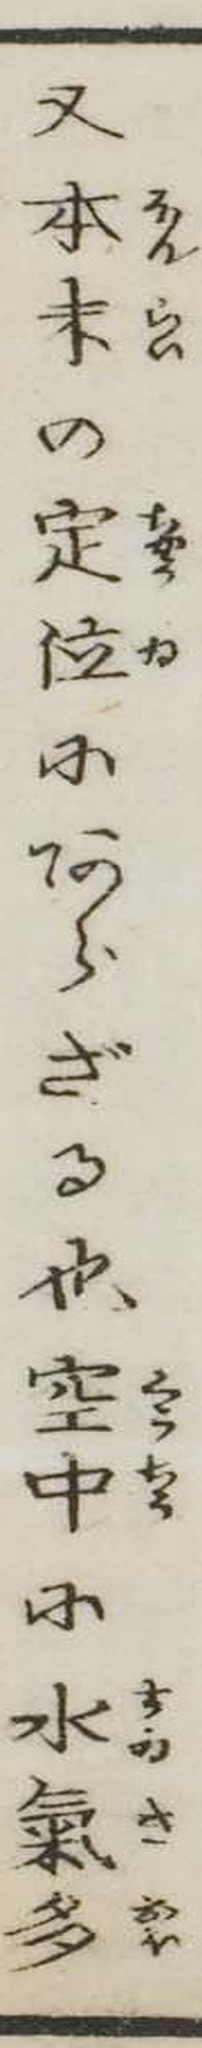又本来の定位にあらざる也空中に水氣多
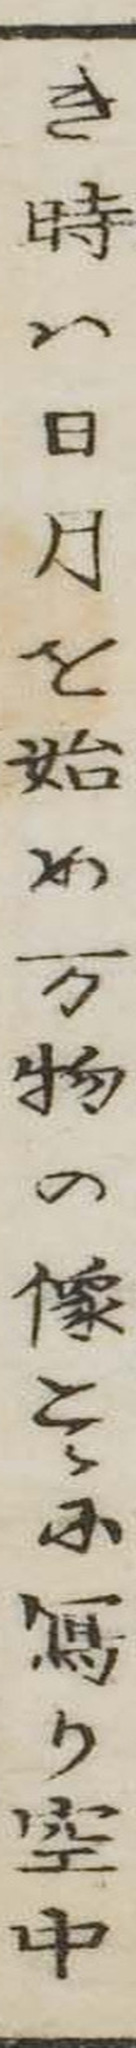き時は日月を始め万物の像こゝに寫り空中

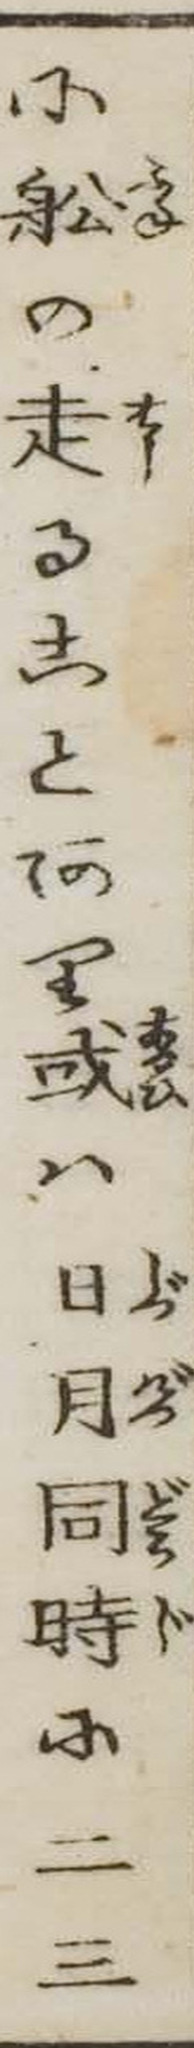に舩の走ることあり或は日月同時に二三
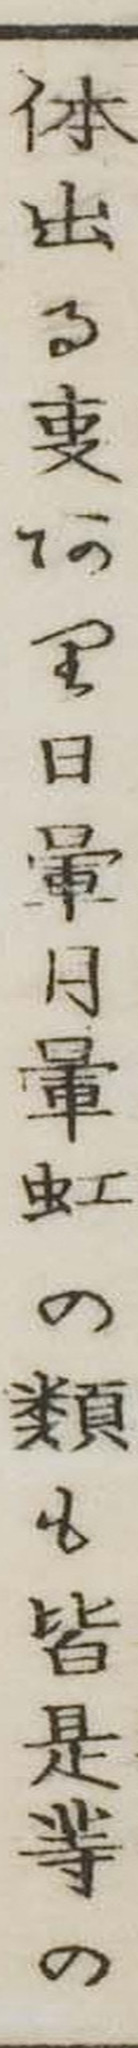体出る叓あり日暈月暈虹の類も皆是等の
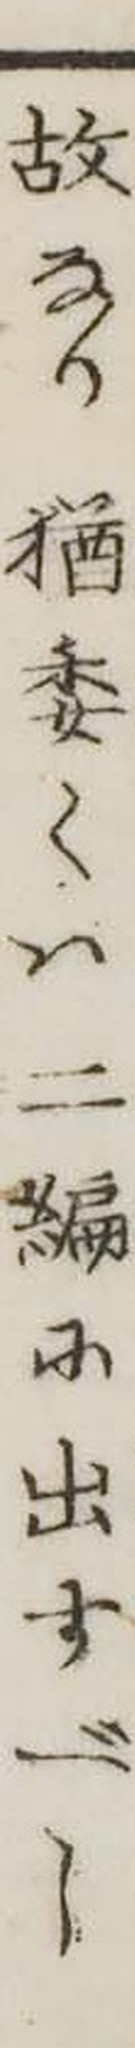故なり猶委くは二編に出すべし
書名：究理知慧の勧 : 訓蒙画入 巻之2
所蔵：東京学芸大学附属図書館
